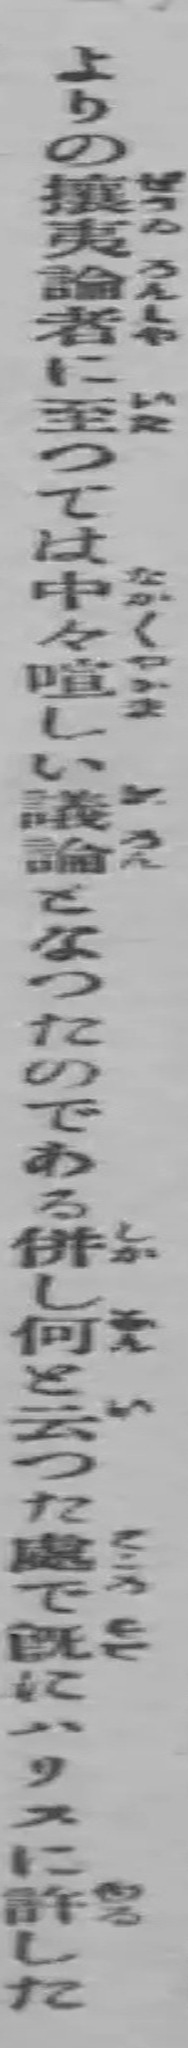よりの攘夷論者に至つては中々喧しい議論となつたのである併し何と云つた処で既にハリスに許した
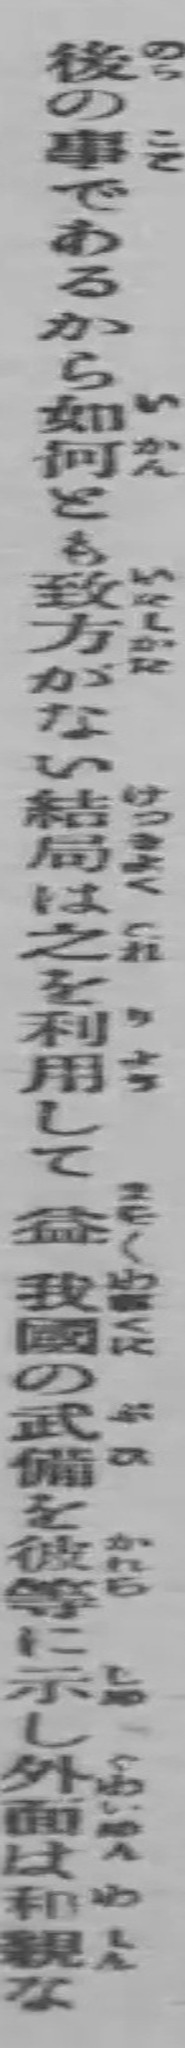後の事であるから如何とも致方がない結局は之を利用して益我国の武備を彼等に示し外面は和親な
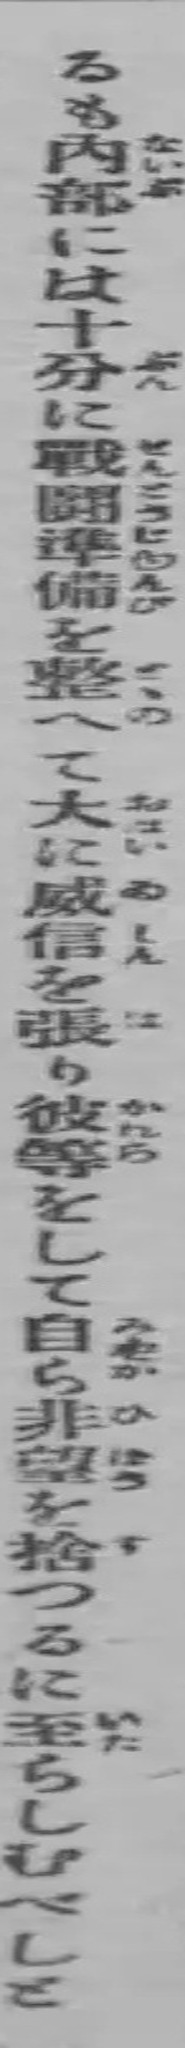るも内部には十分に戦闘準備を整へて大に威信を張り彼等をして自ら非望を捨つるに至らしむべしと
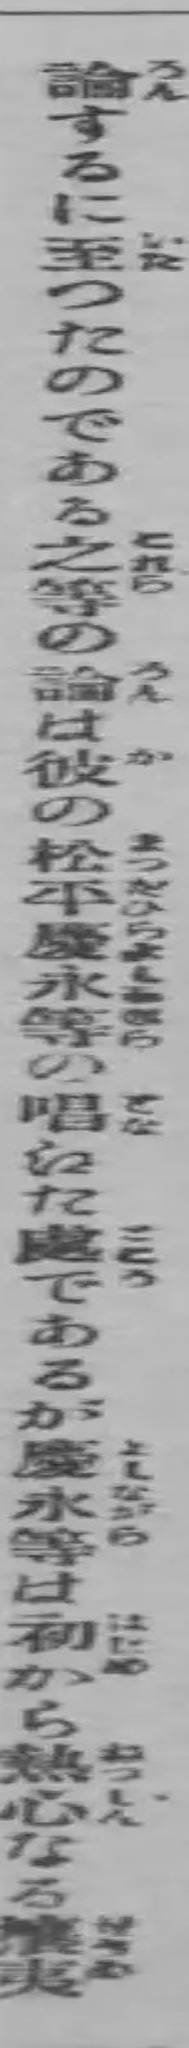論するに至つたのである之等の論は彼の松平慶永等の唱えた処であるが慶永等は初から熱心なる攘夷
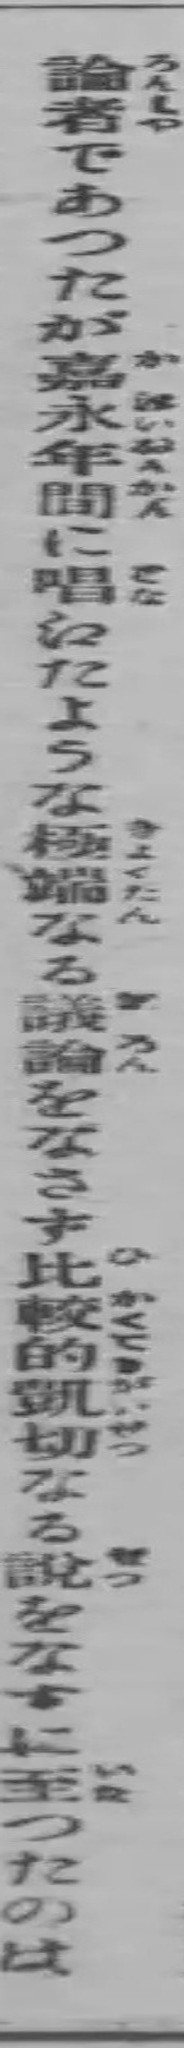論者であつたが嘉永年間に唱えたような極端なる議論をなさず比較的凱切なる説をなすに至つたのは
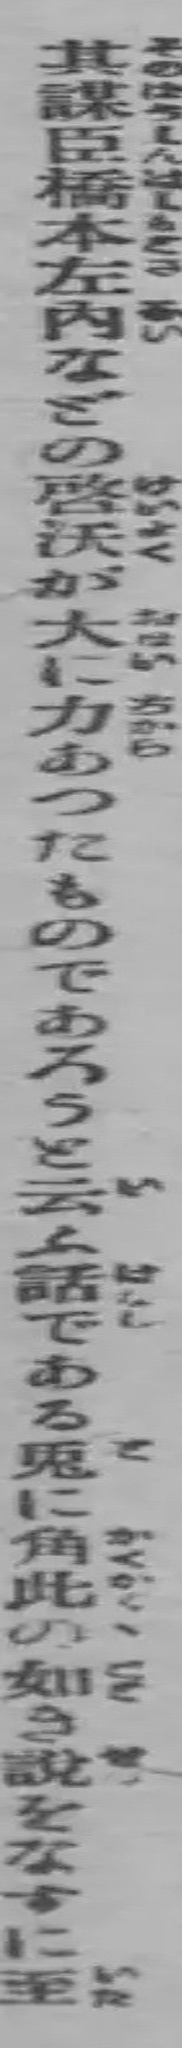其謀臣橋本左内などの啓沃が大に力あつたものであろうと云ふ話である兎に角此の如き説をなすに至

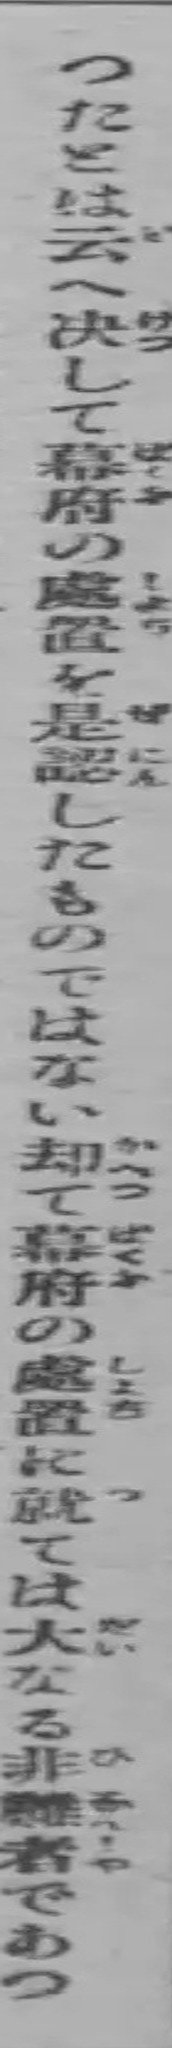つたとは云へ決して幕府の処置を是認したものではない却て幕府の処置に就ては大なる非難者であつ
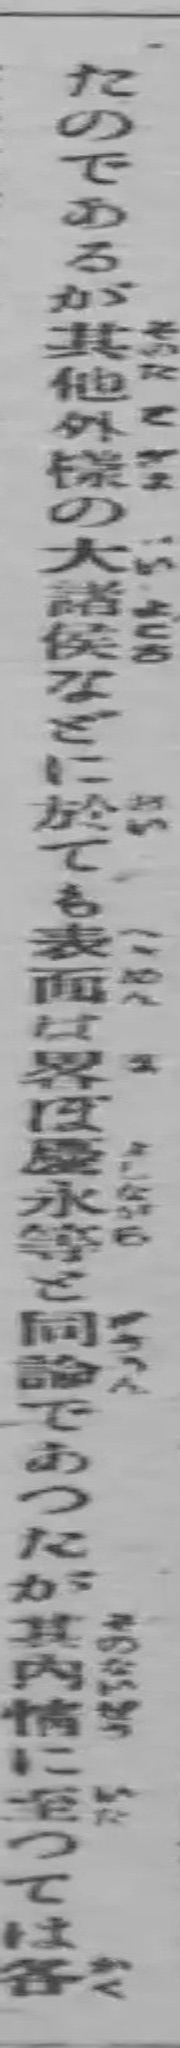たのであるが其他外様の大諸侯などに於ても表面は略ぼ慶永等と同論であつたが其内情に至つては各
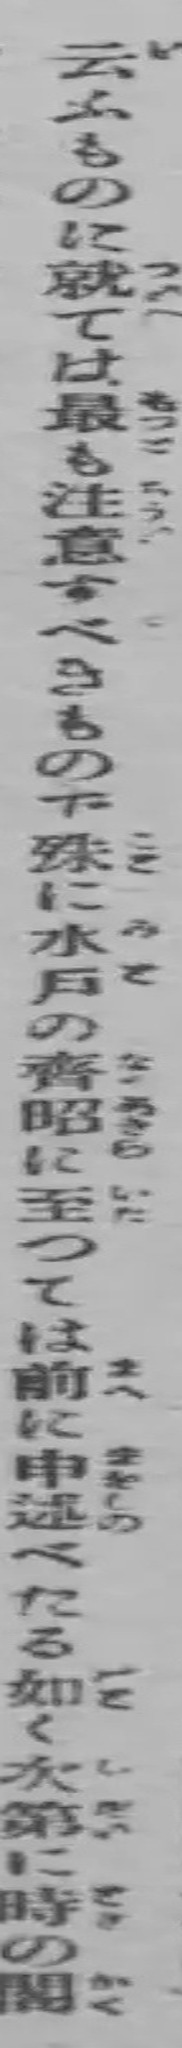云ふものに就ては最も注意すべきもので殊に水戸の斉昭に至つては前に申述べたる如く次第に時の閣
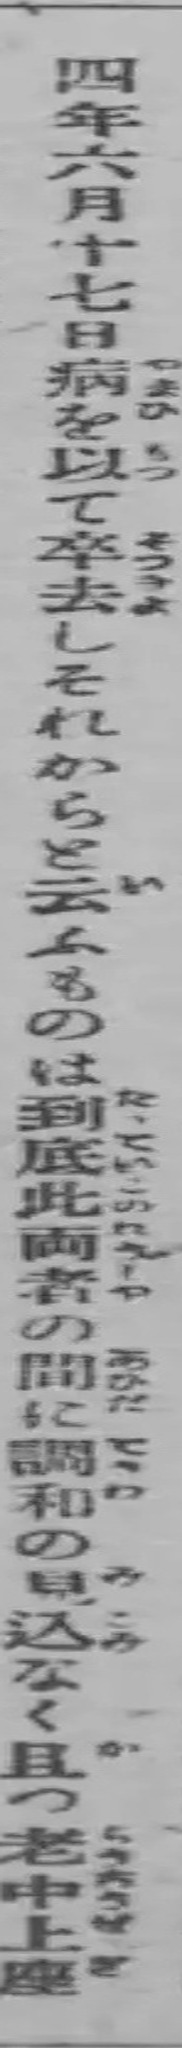四年六月十七日病を以て卒去しそれからと云ふものは到底此両者の間に調和の見込なく且つ老中上座
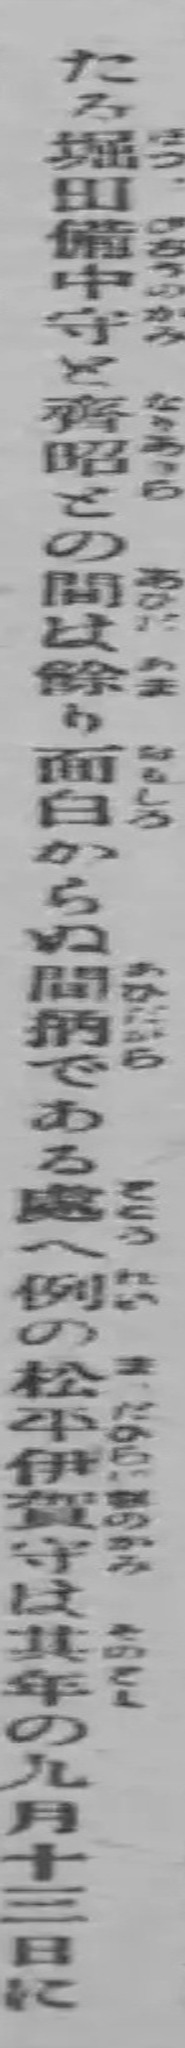たる堀田備中守と斉昭との間は余面白からぬ間柄である処へ例の松平伊賀守は其年の九月十三日に
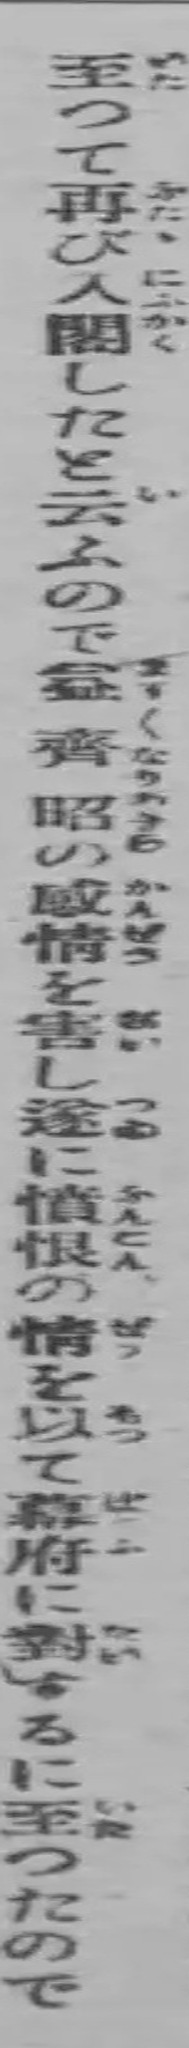至つて再び入閣したと云ふので益斉昭の感情を害し遂に憤恨の情を以て幕府に対するに至つたので
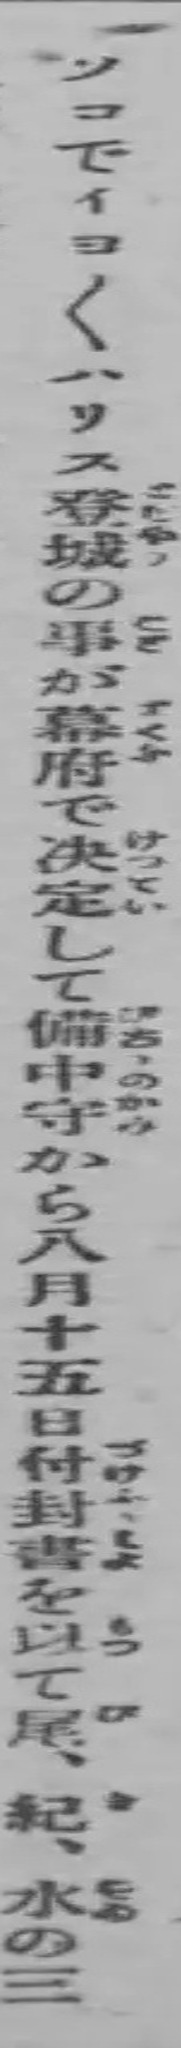ソコでイヨ〳〵ハリス登城の事が幕府で決定して備中守から八月十五日付封書を以て尾、紀、水の三
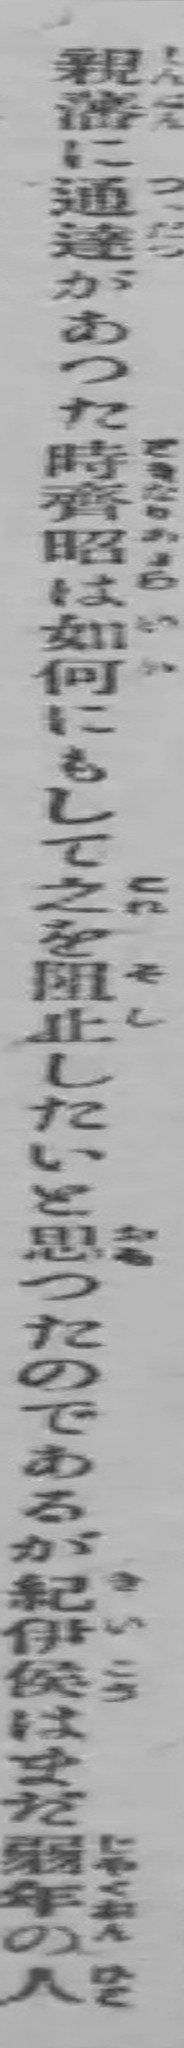親藩に通達があつた時斉昭は如何にもして之を阻止したいと思つたのであるが紀伊侯はまだ弱年の人
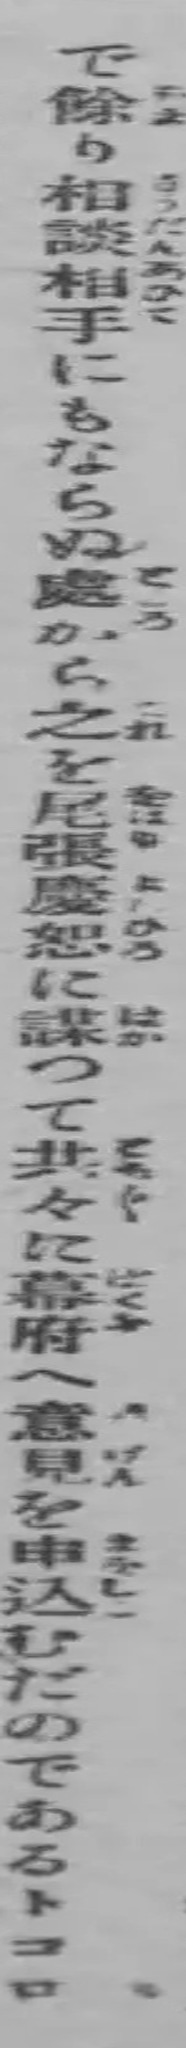で余相談相手にもならぬ処から之を尾張慶恕に謀つて共々に幕府へ意見を申込むだのであるトコロ
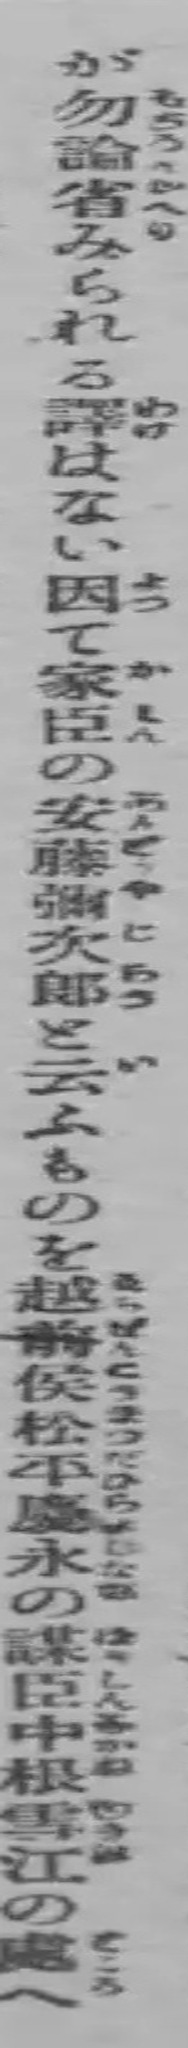が勿論省みられる訳はない因て家臣の安藤弥次郎と云ふものを越前侯松平慶永の謀臣中根雪江の処へ
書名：豊橋市史談
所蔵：国立国会図書館 National Diet Library, JAPAN
